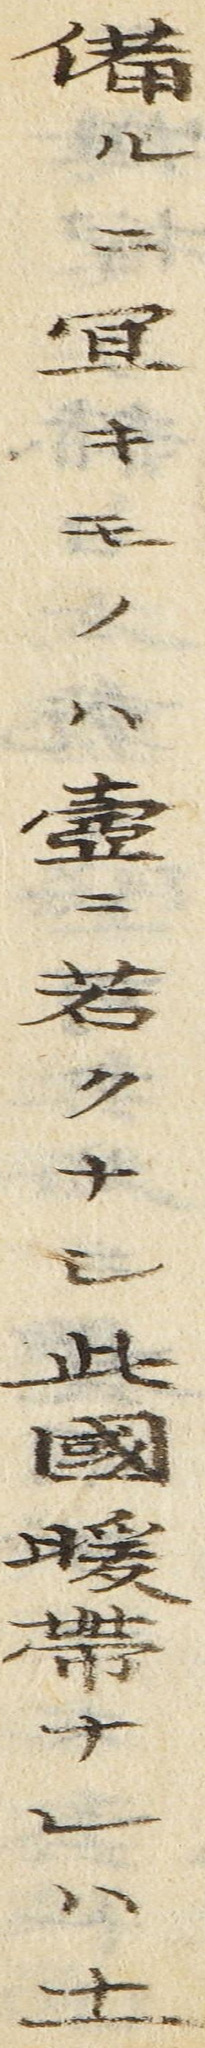備ルニ宜キモノハ壺ニ若クナシ此国暖帯ナレハ土

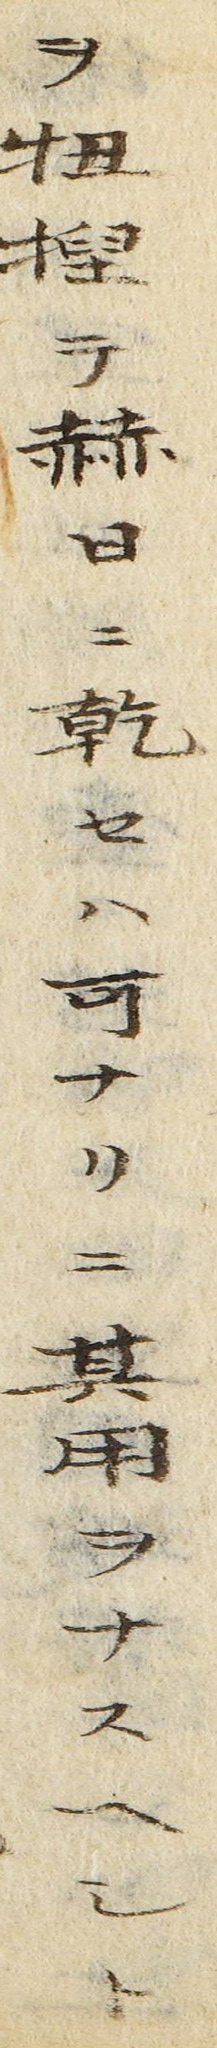ヲ扭揑テ赫日ニ乾セハ可ナリニ其用ヲナスヘシト
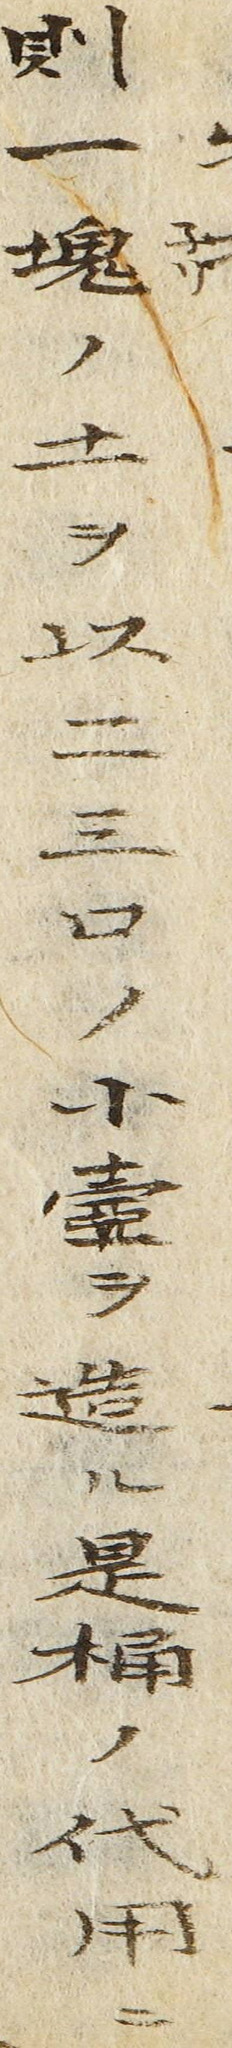則一塊ノ土ヲ以二三口ノ小壺ヲ造ル是桶ノ代用ニ
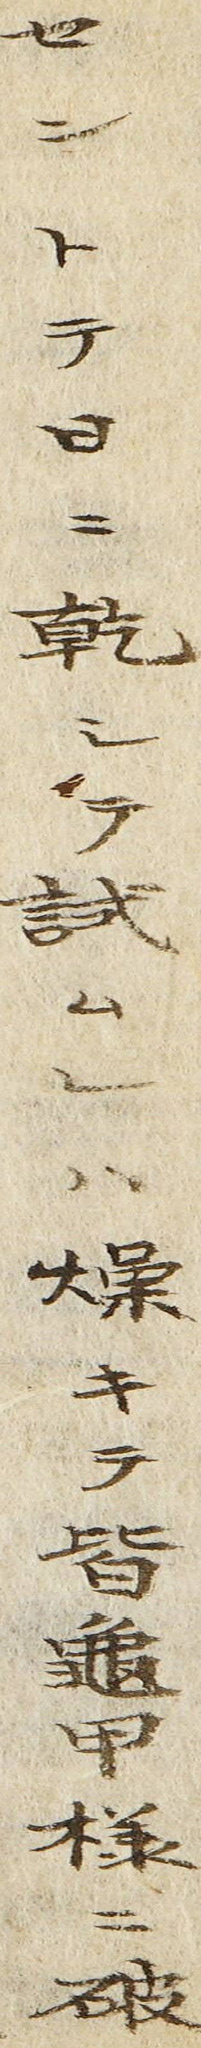セントテ日ニ乾シテ試ムレハ燥キテ皆亀甲様ニ破
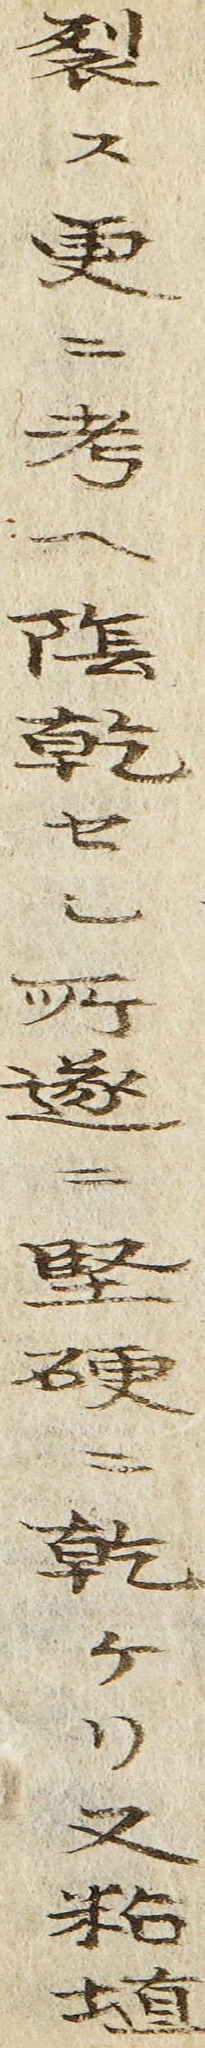裂ス更ニ考ヘ陰乾セシ所遂ニ堅硬ニ乾ケリ又粘埴
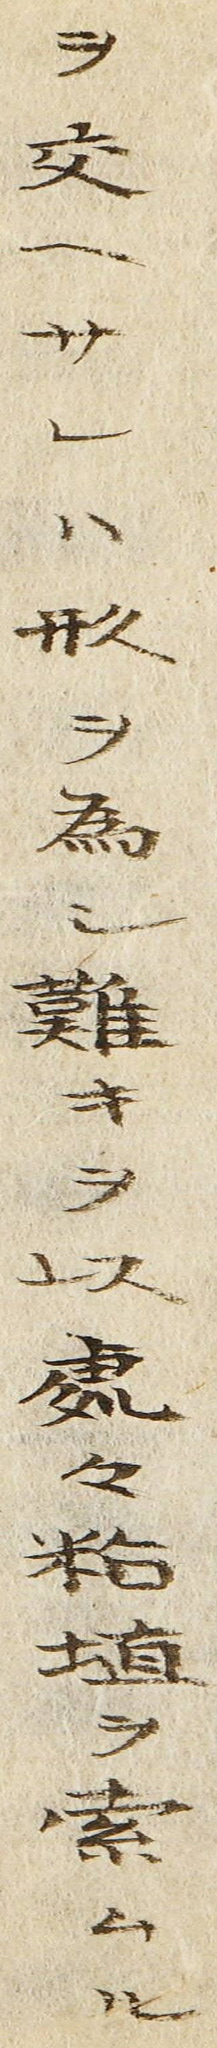ヲ交ヘサレハ形ヲ為シ難キヲ以処々粘埴ヲ索ムル
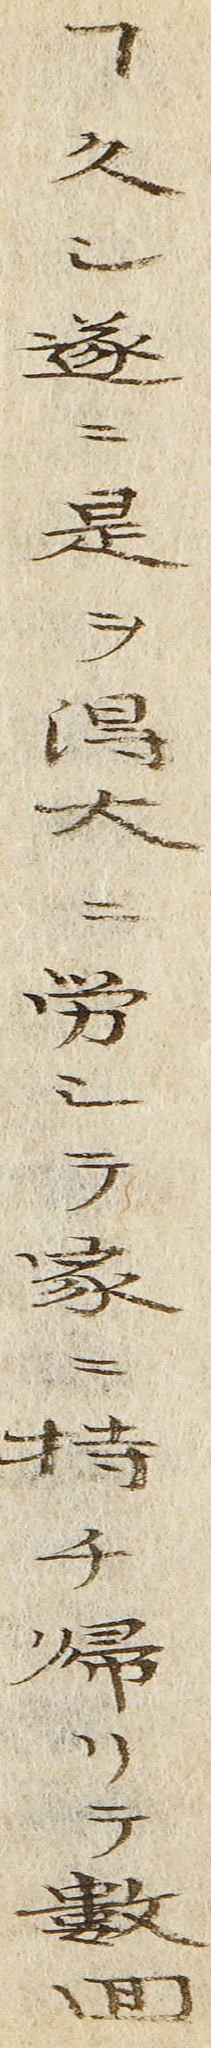コト久シ遂ニ是ヲ得大ニ労シテ家ニ持チ帰リテ数回
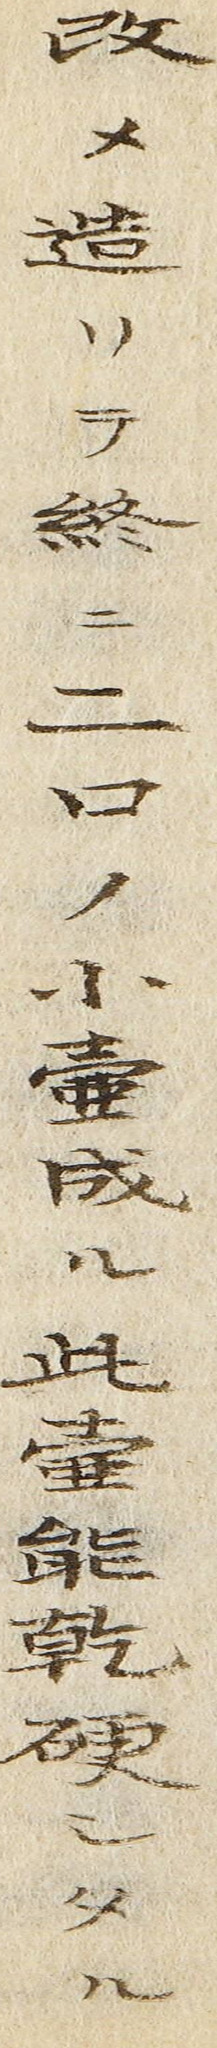改メ造リテ終ニ二口ノ小壺成ル此壺能乾硬シタル
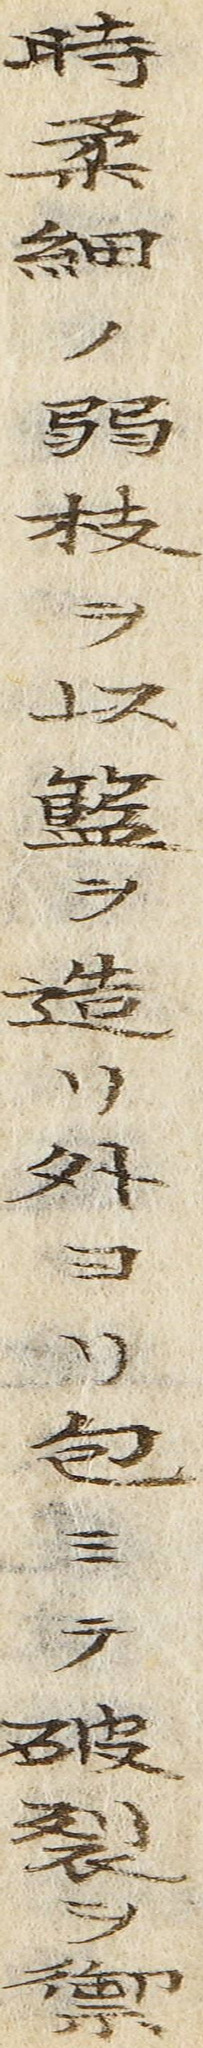時柔細ノ弱枝ヲ以籃ヲ造リ外ヨリ包ミテ破裂ヲ禦
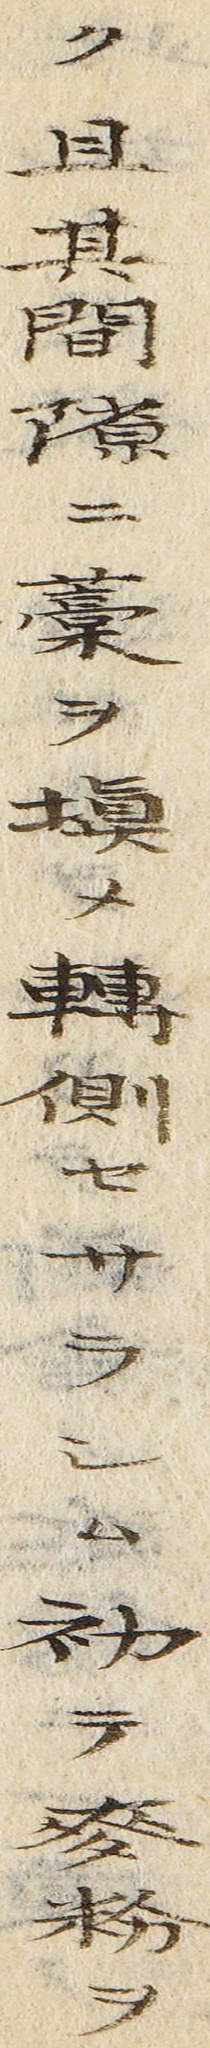ク且其間隙ニ藁ヲ填メ転側セサラシム初テ麦粉ヲ
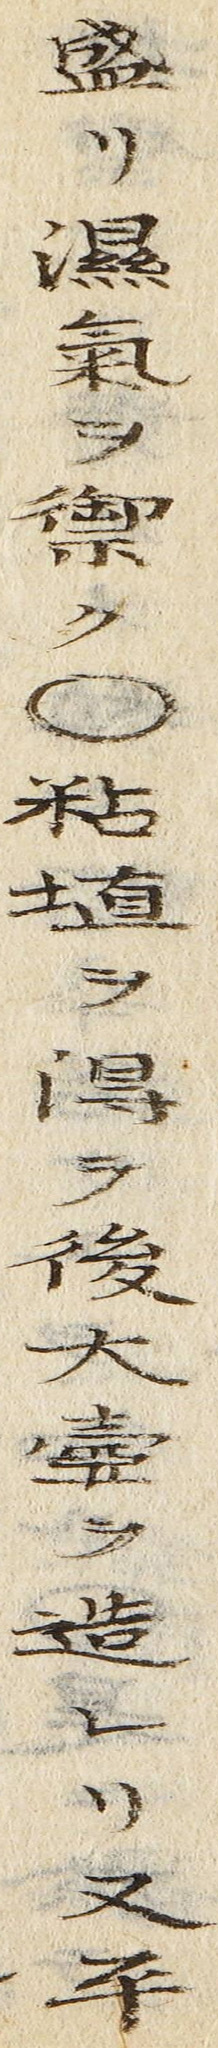盛リ湿気ヲ禦ク◯粘埴ヲ得テ後大壺ヲ造レリ又平
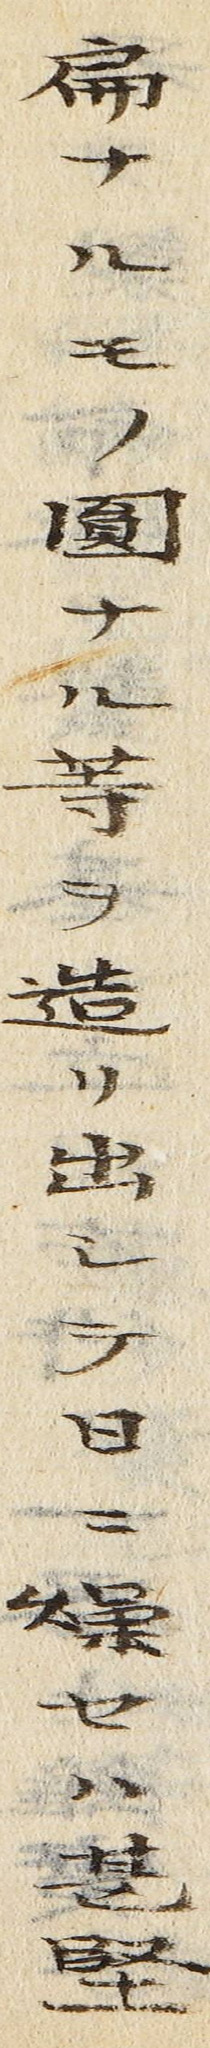扁ナルモノ円ナル等ヲ造リ出シテ日ニ燥セハ甚堅
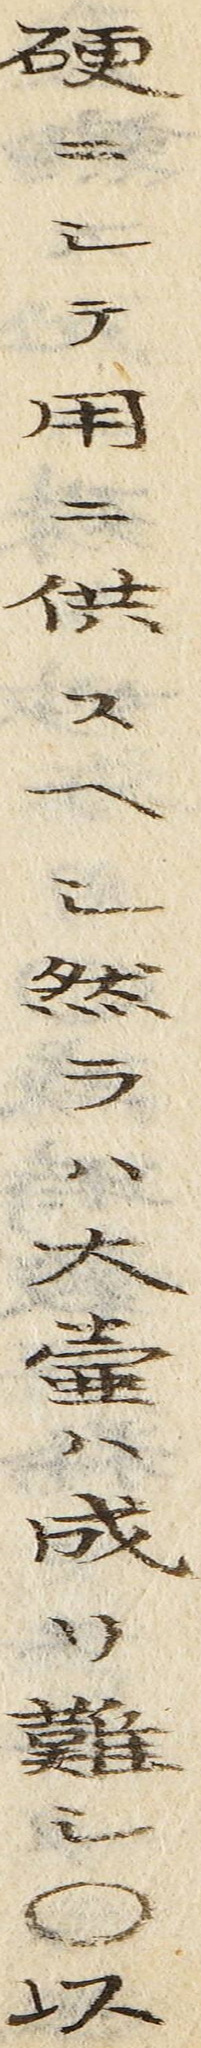硬ニシテ用ニ供スヘシ然ラハ大壺ハ成リ難シ◯以
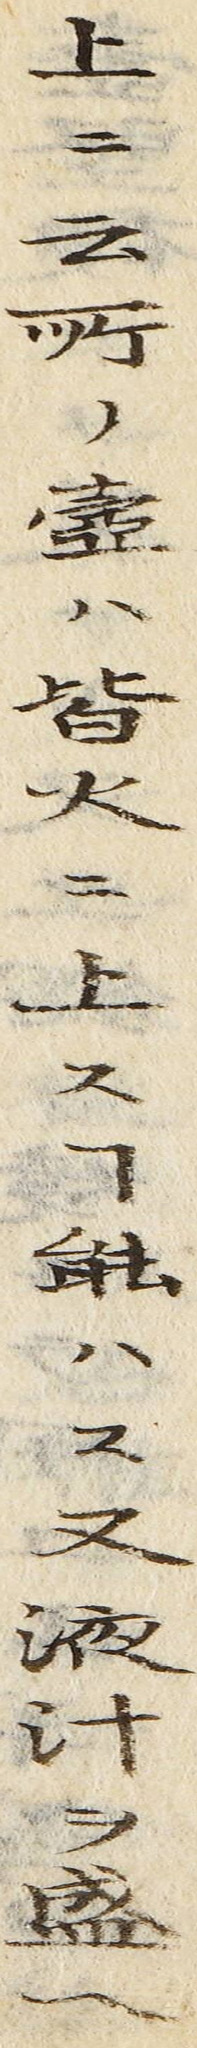上ニ云所ノ壺ハ皆火ニ上スコト能ハス又液汁ヲ盛ヘ
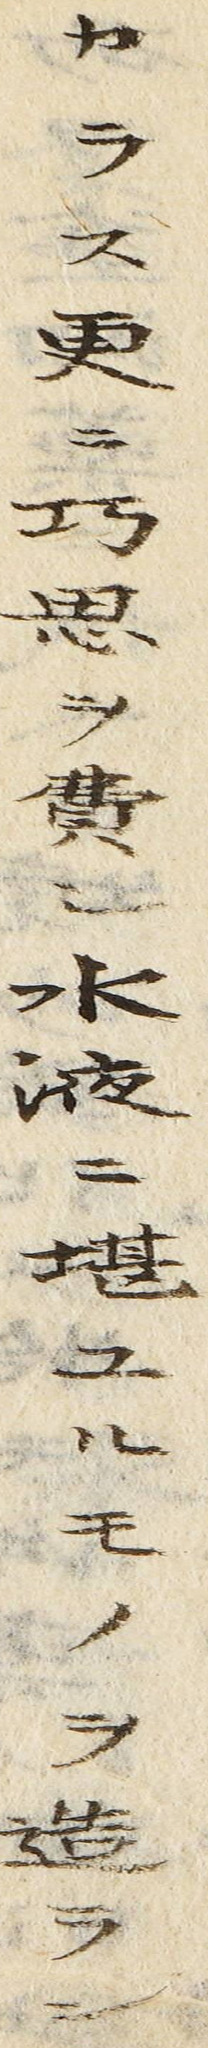カラス更ニ巧思ヲ費シ水液ニ堪ユルモノヲ造ラン
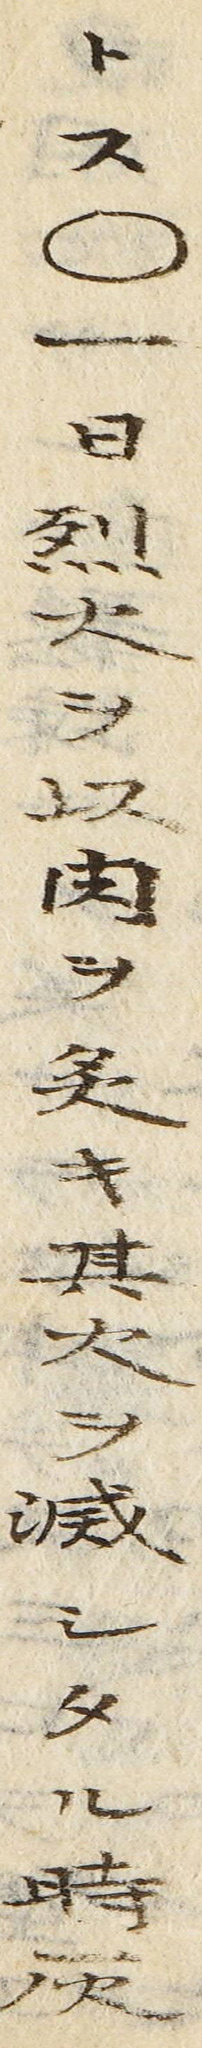トス◯一日烈火ヲ以肉ヲ炙キ其火ヲ滅シタル時灰
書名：漂流紀事
